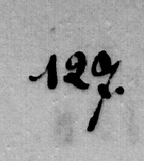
1836.
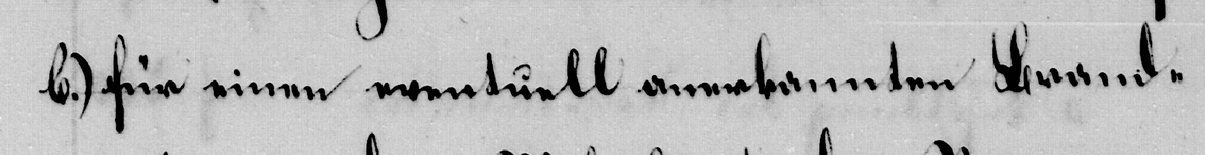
b.) für einen eventuell anerkannten Brand¬
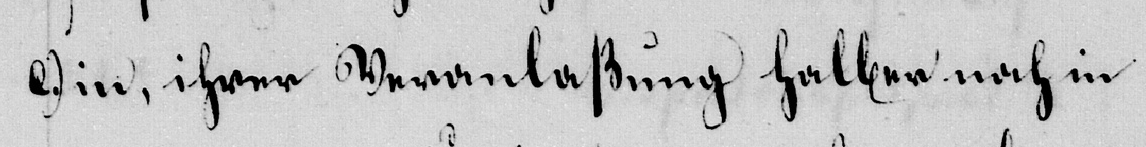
in, ihrer Veranlaßung halber noch in
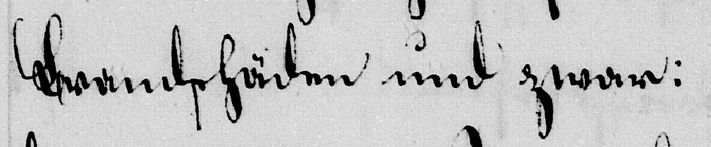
Brandschaden und zwar:
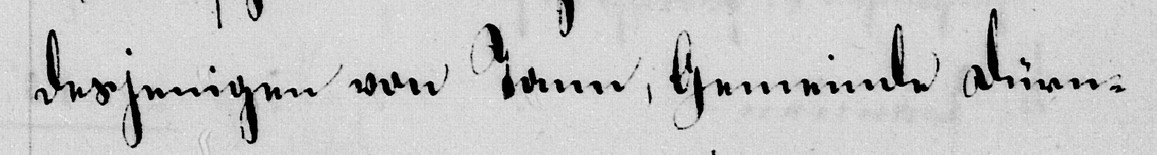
desjenigen von Tann, Gemeinde Dürn¬
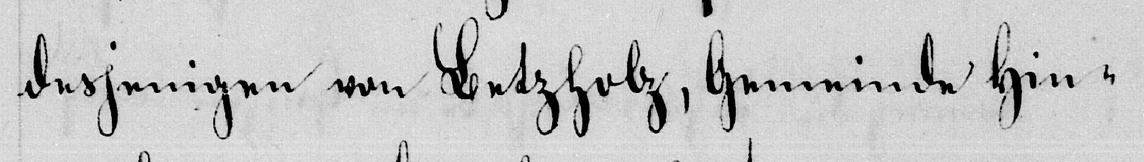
desjenigen von Betzholz, Gemeinde Hin¬
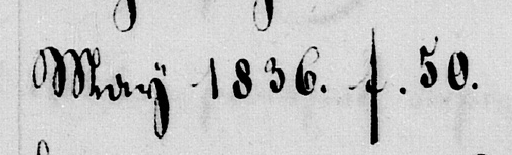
May 1836. f. 50.
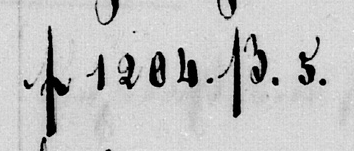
f. 1204. ß. 5.
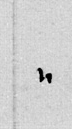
48.
